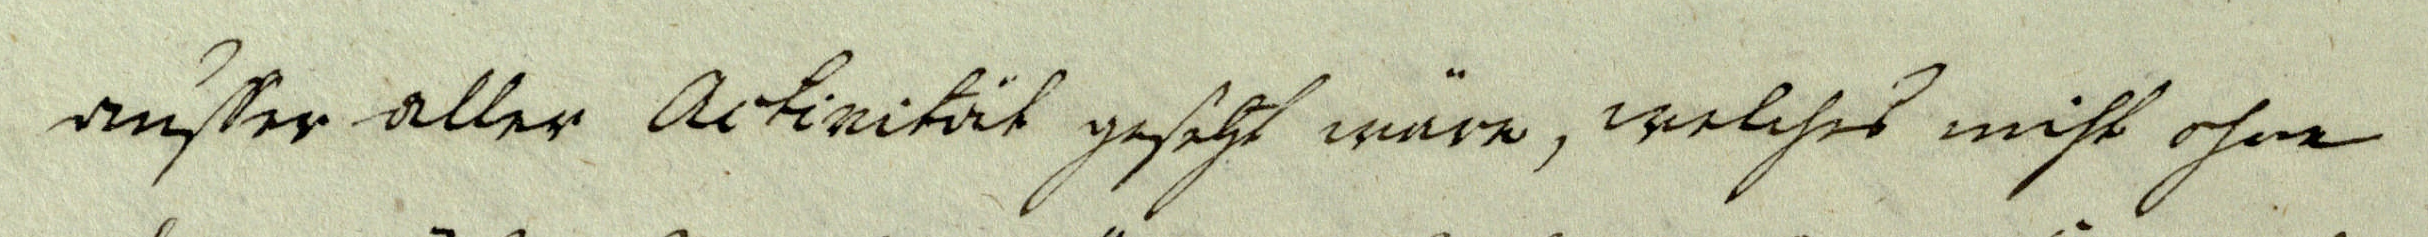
ausser aller Activität gesetzt wäre, welches nicht ohne
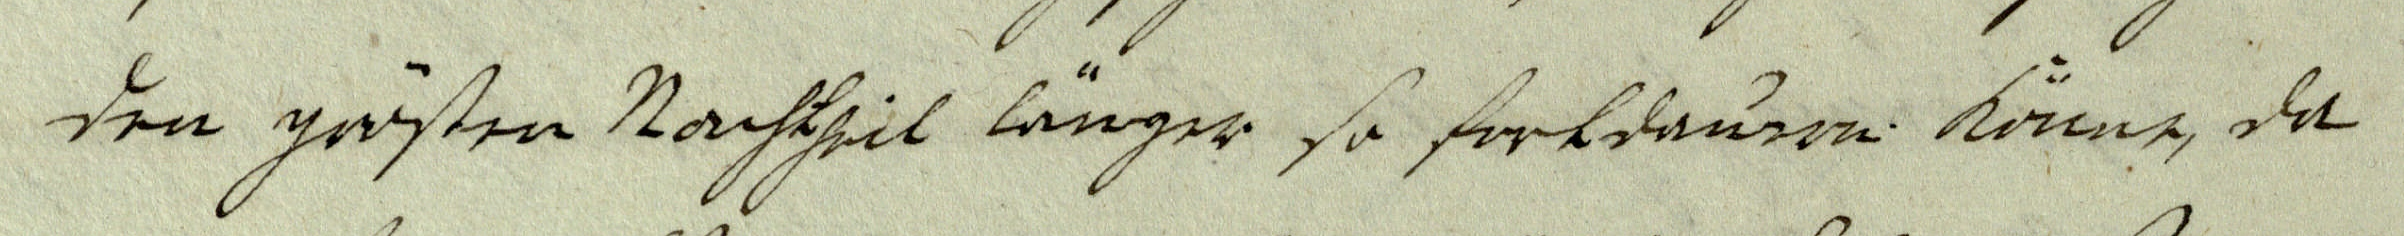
den grösten Nachtheil länger so fortdauern könne, da
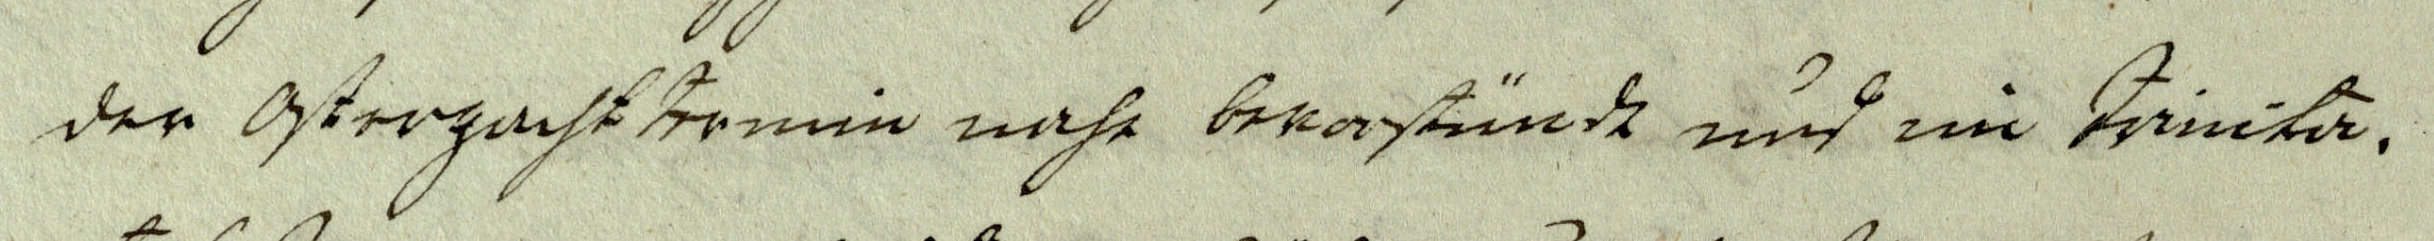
der Osterpacht Termin nahe bevorstünde und im Trinita¬
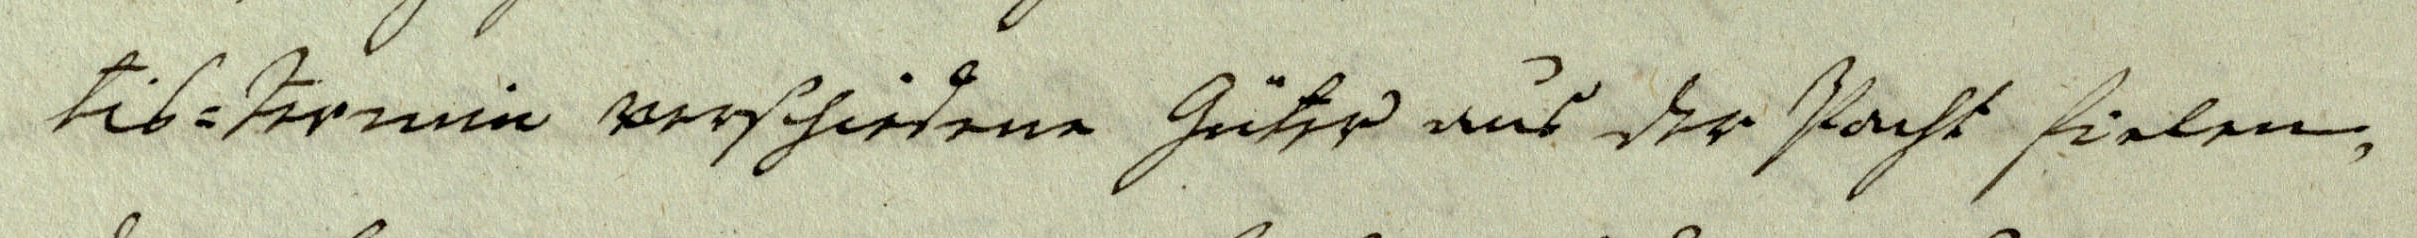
tis-Termin verschiedene Güter aus der Pacht fielen,
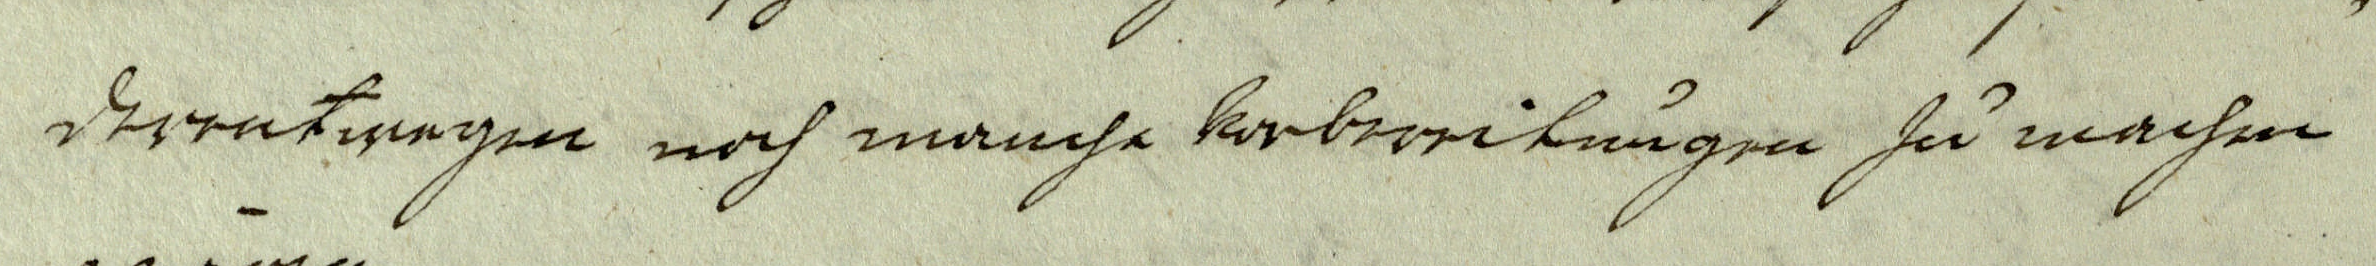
derentwegen noch manche Vorbereitungen zu machen
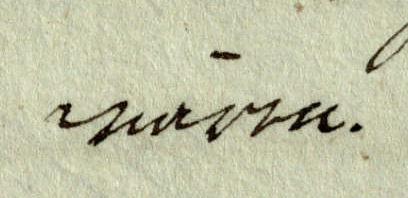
wären.
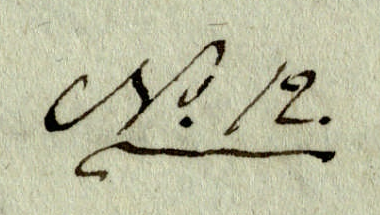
Nº 12.
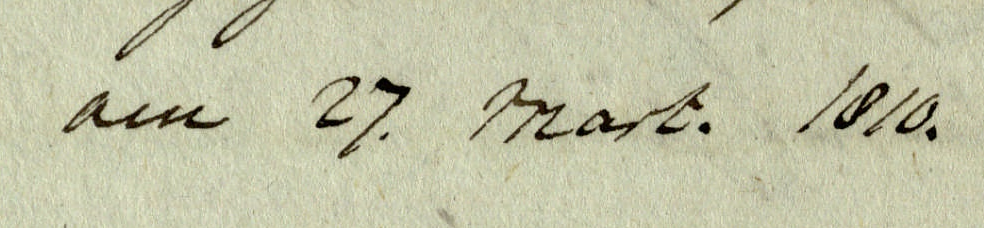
am 27. Mart. 1810.
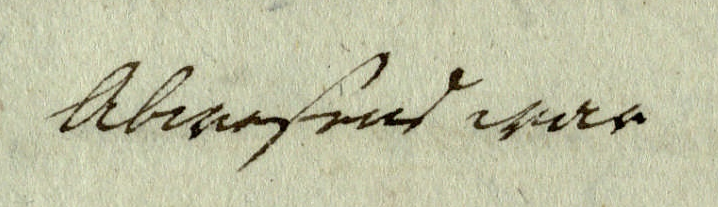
Abwesend war
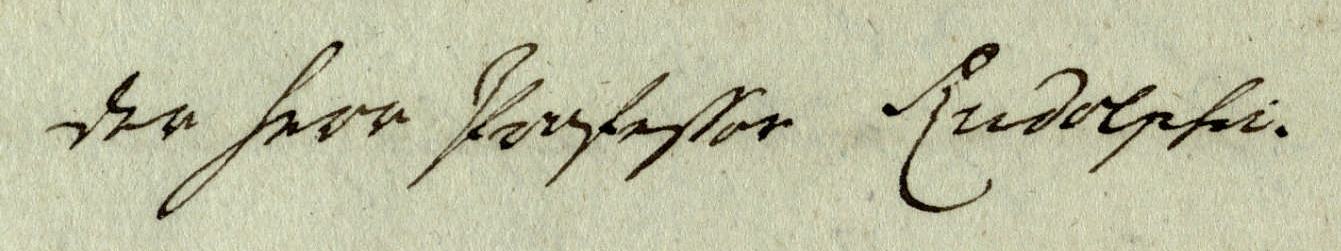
der Herr Professor Rudolphi.
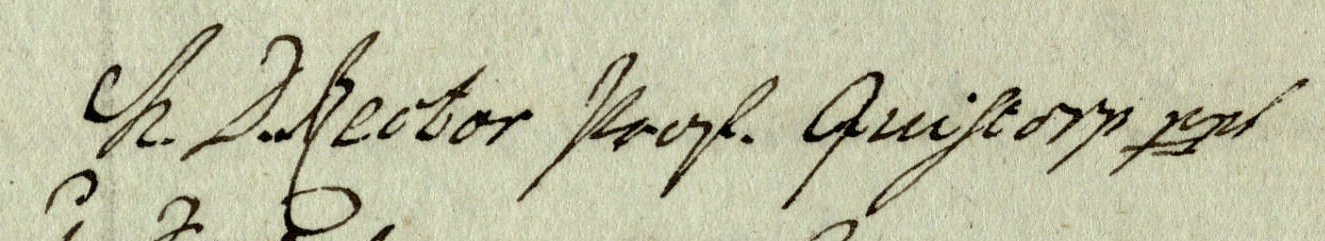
M. Rector Prof. Quistorp ppt
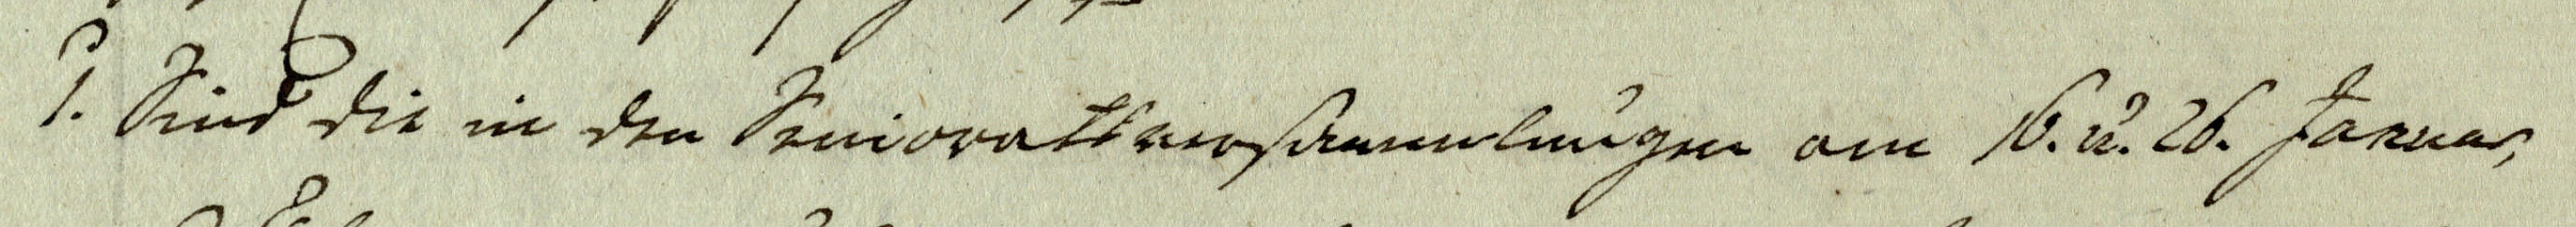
1. Sind die in den Senioratsversammlungen am 16. u. 26. Januar,
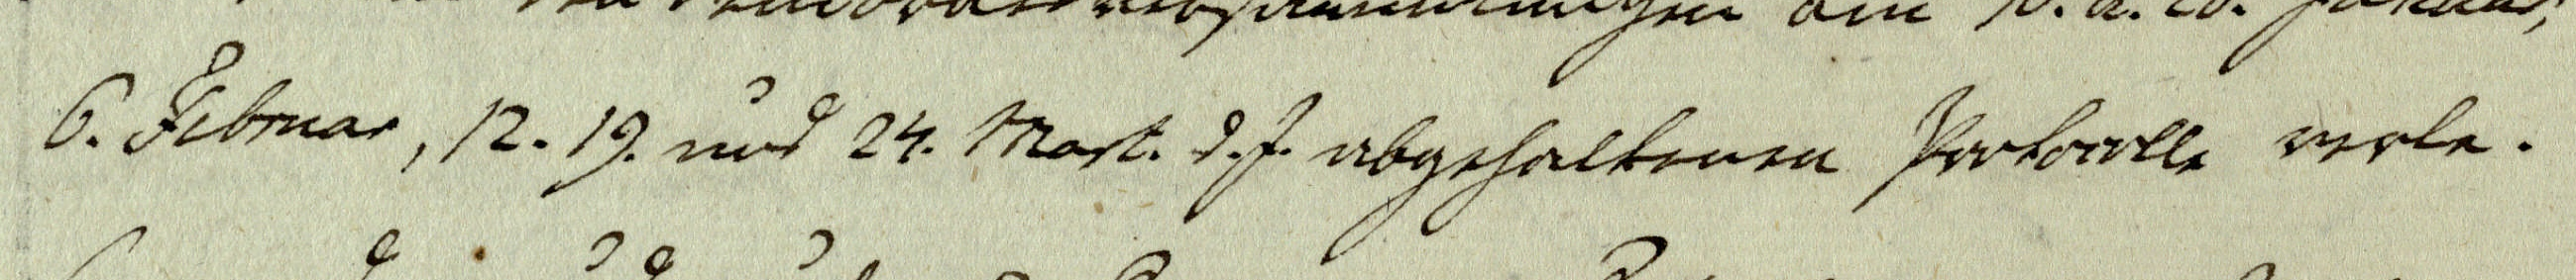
6. Februar, 12. 19. und 24. Mart. d. J. abgehaltenen Protocolle verle¬
